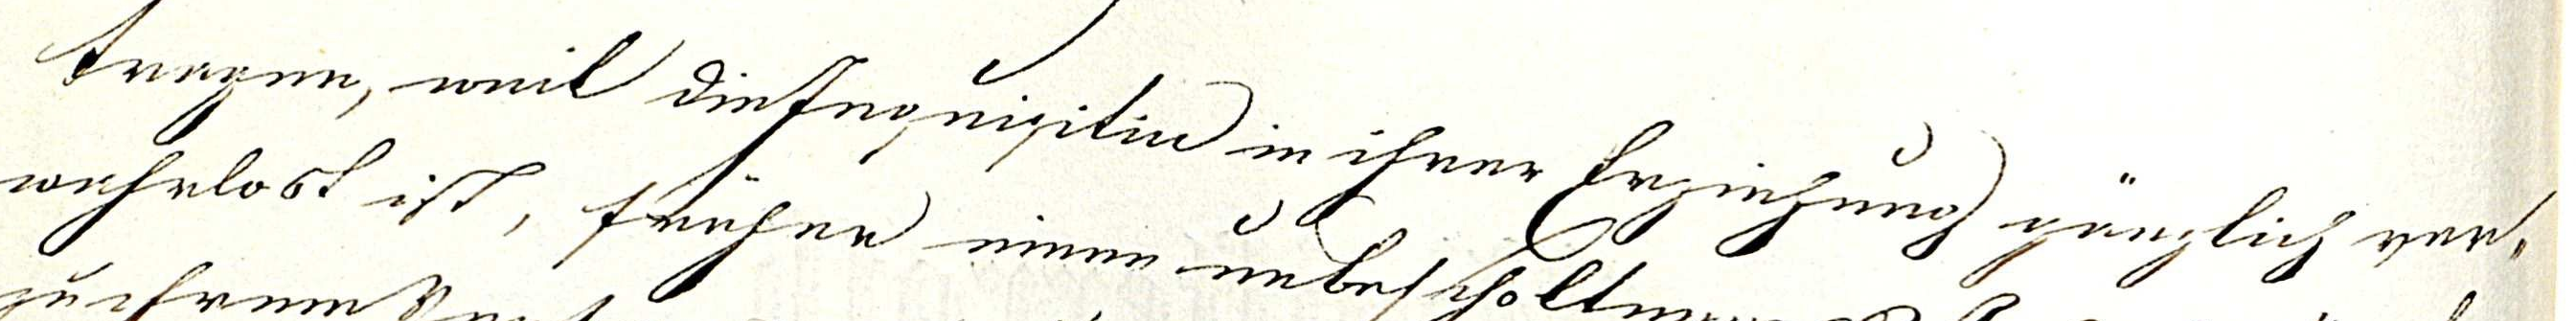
tragen, weil die Jnquisitin in ihrer Erziehung gänzlich ver¬
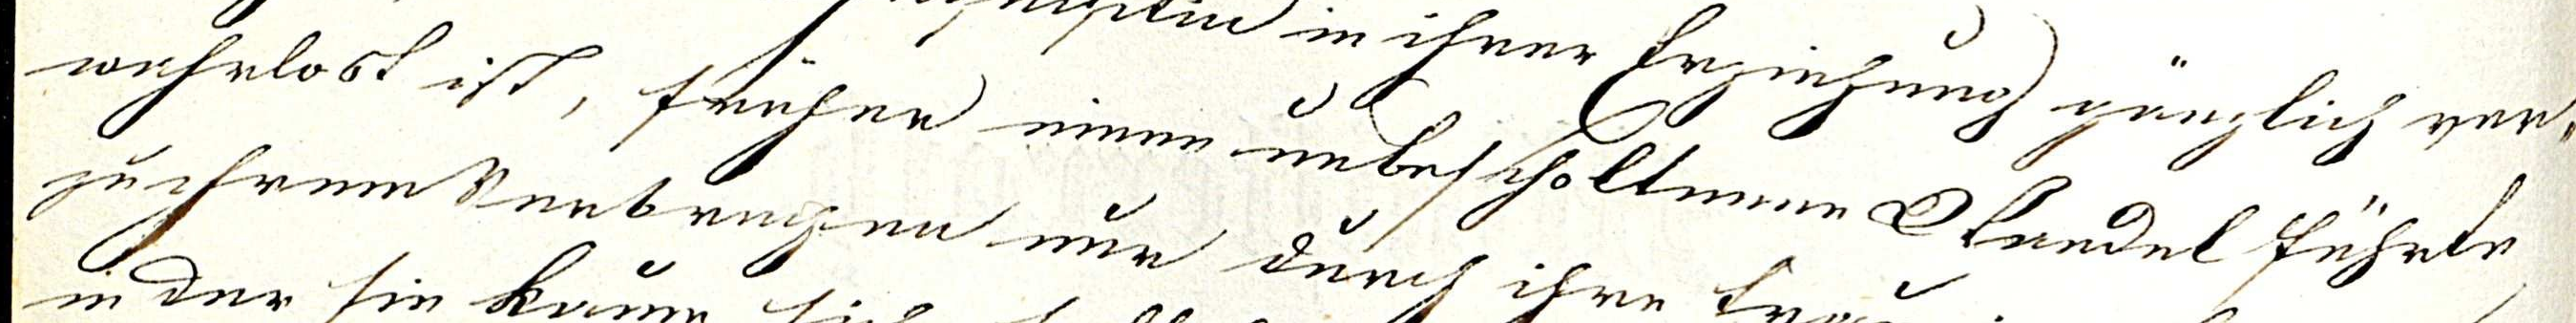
wahrlost ist, früher einen unbescholtenen Wandel führte
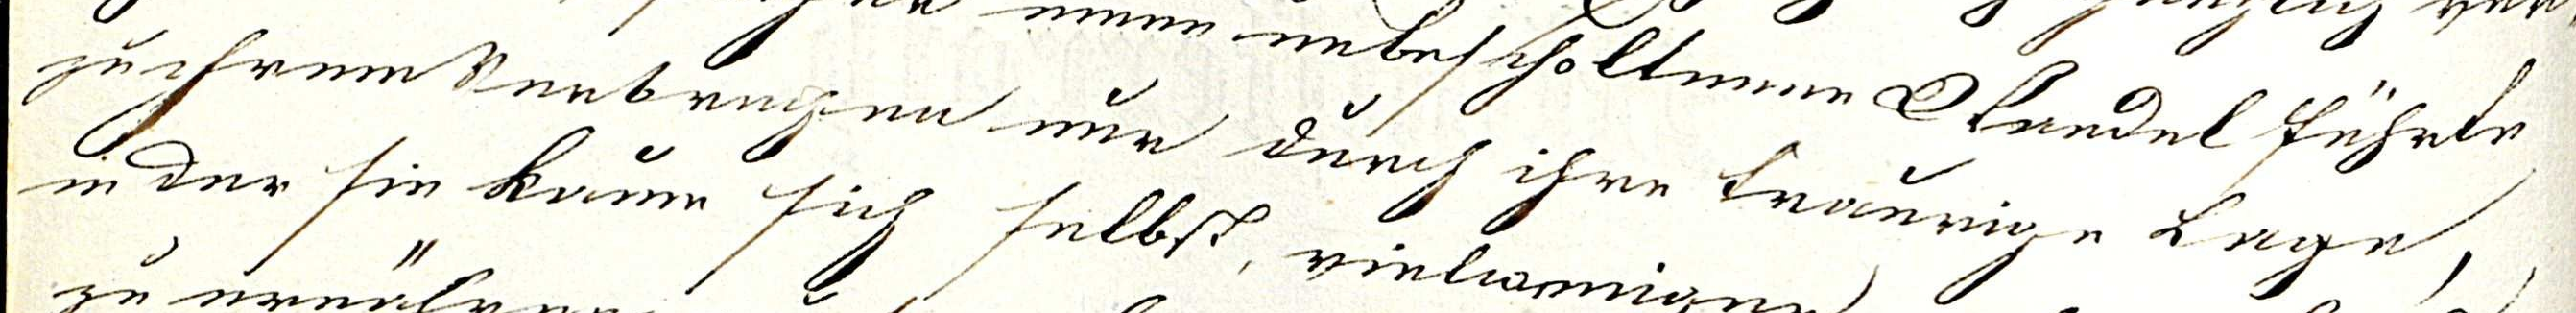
zu ihrem Verbrechen nur durch ihre traurige Lage,
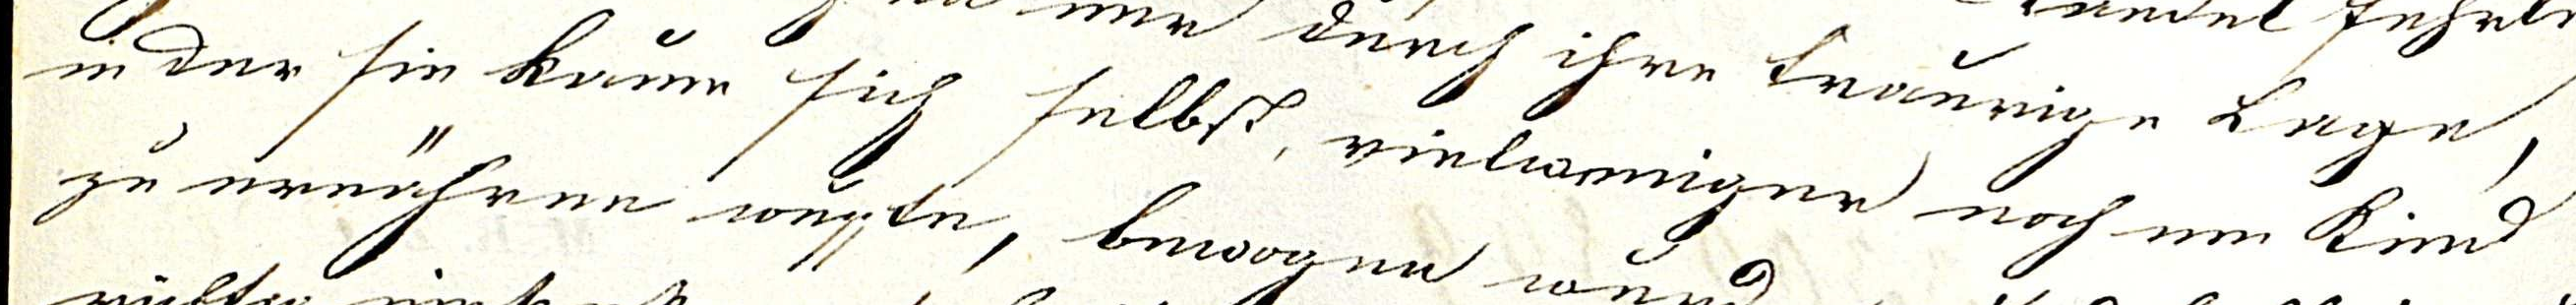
in der sie kaum sich selbst, vielweniger noch xx Kind
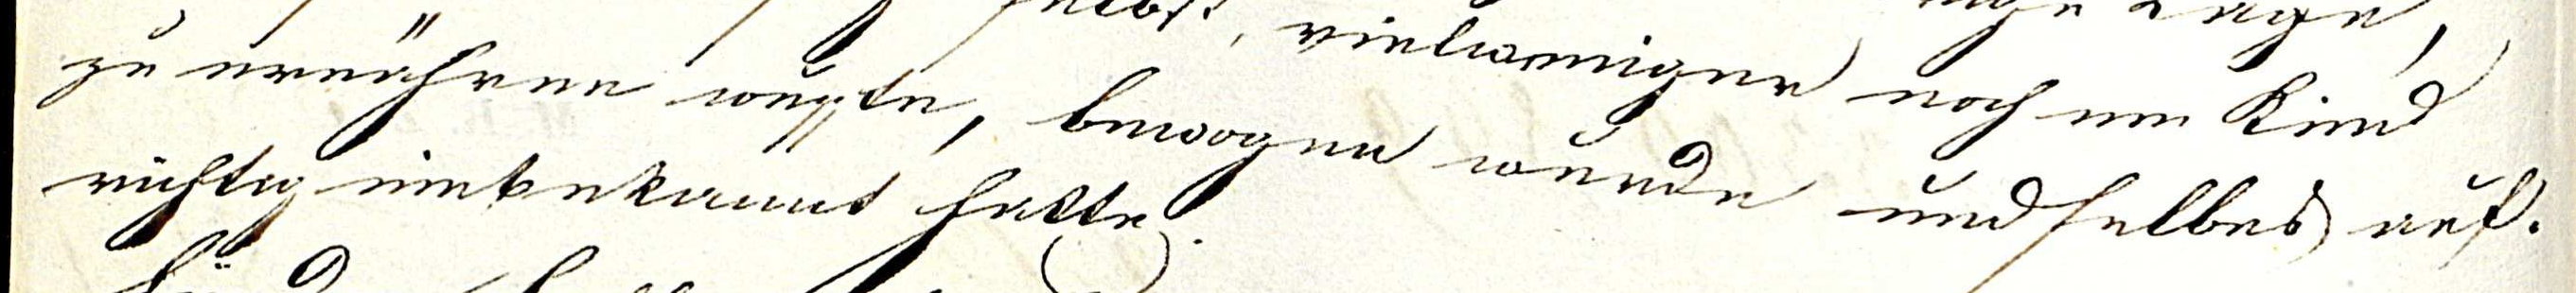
zu ernähren wusste, bewogen wurde und selbes auf¬
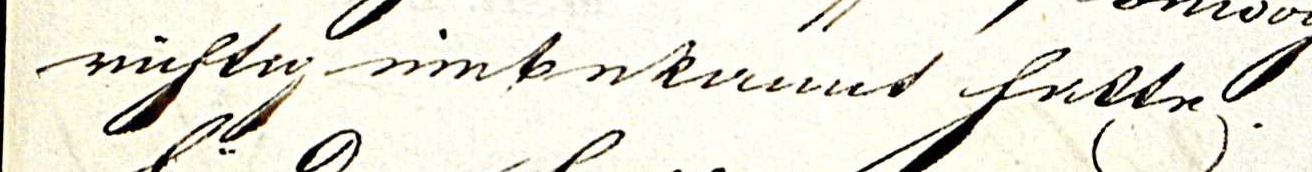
richtig ein bekannt hatte.
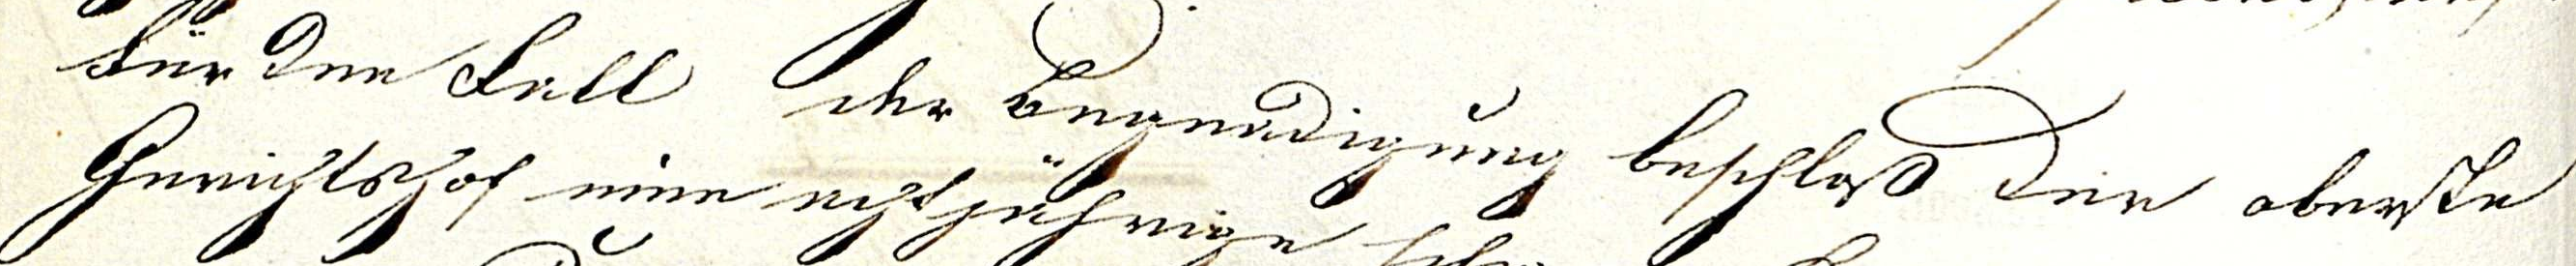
Für den Fall der Begnadigung beschloß der oberste
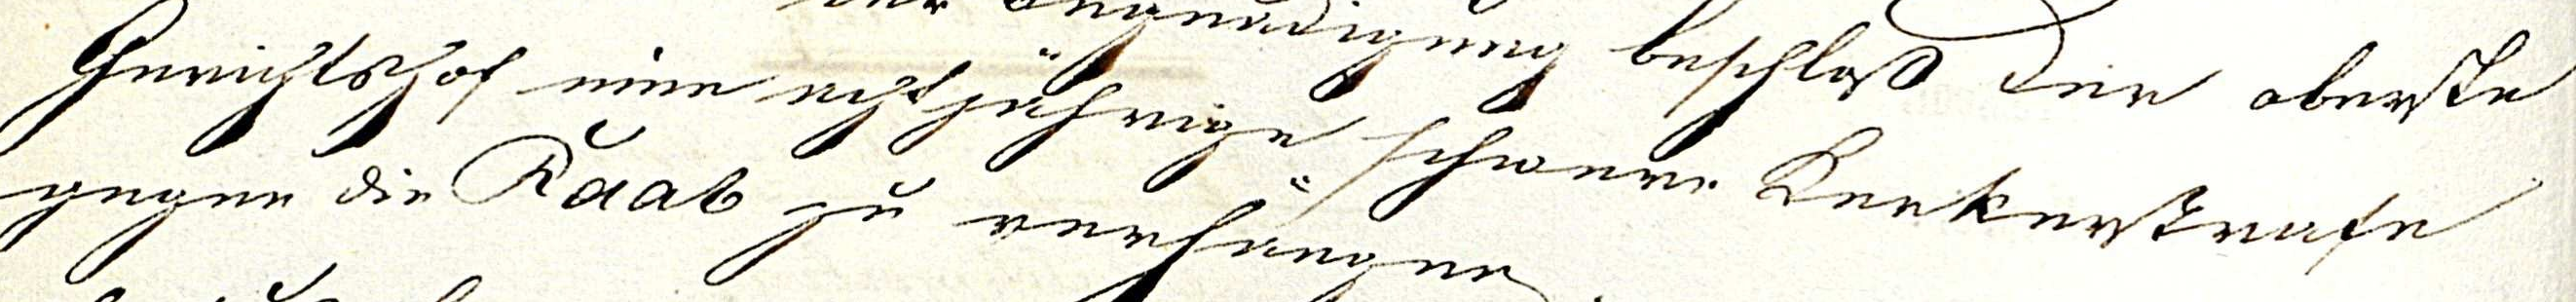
Gerichtshof eine achtjährige schwere Kerkerstrafe
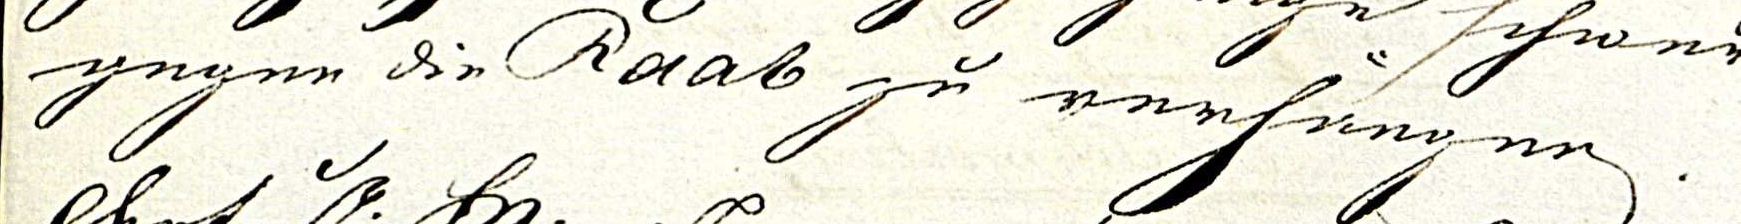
gegen die Raab zu verhängen.
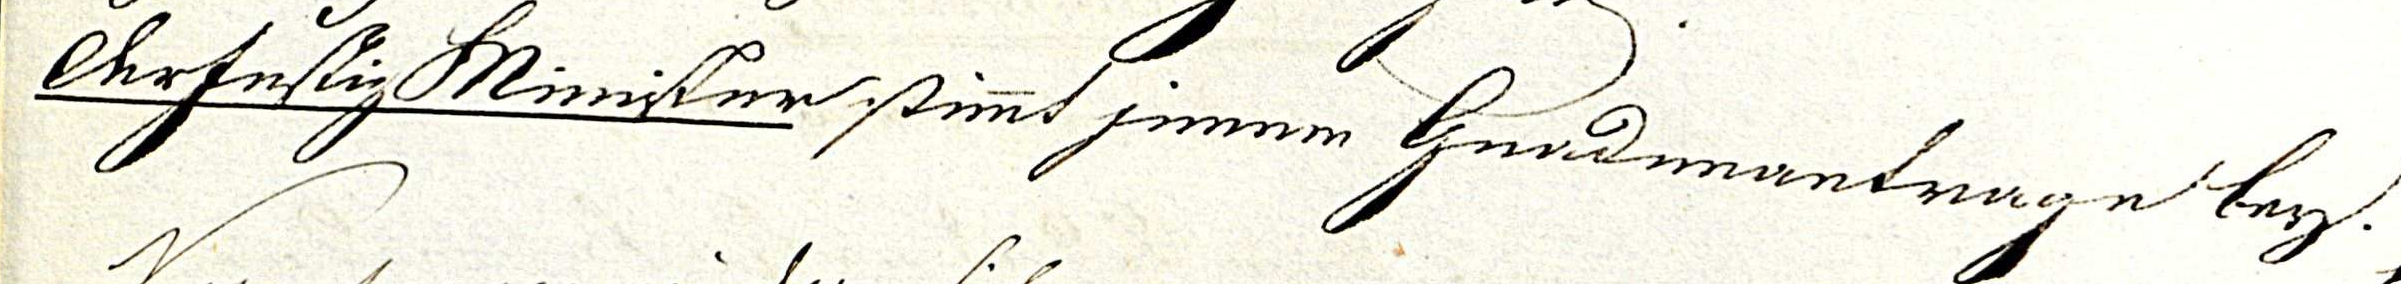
Derxx Minister stimmt jenem Gnadenantrage bey.
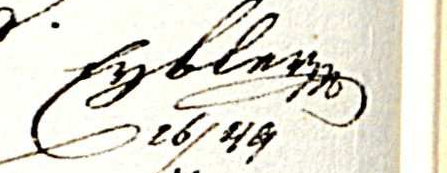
Eyblerxx
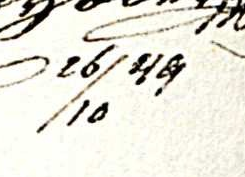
26/10 49
